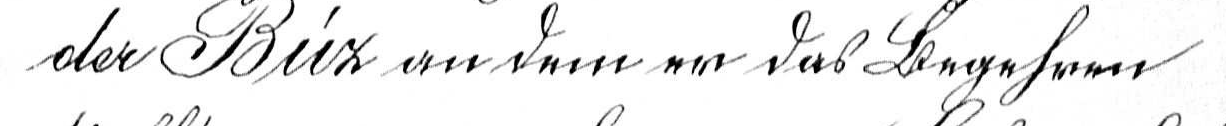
der Búz an dem er das Begehren
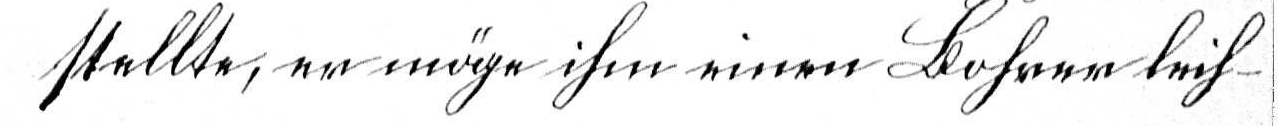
stellte, er möge ihm einen Bohrer lei¬
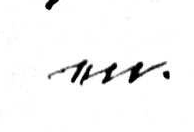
hen.
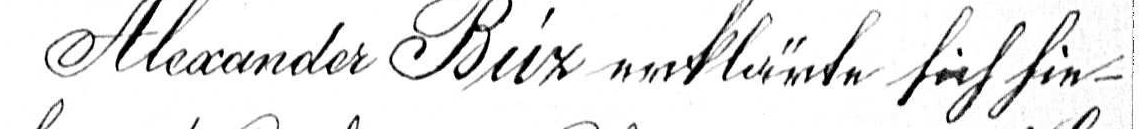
Alexander Búz erklärte sich hie¬
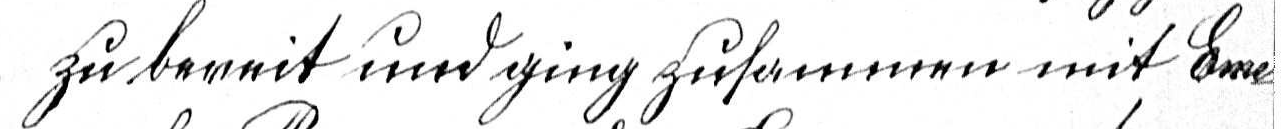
zu bereit und ging zusammen mit Eme¬
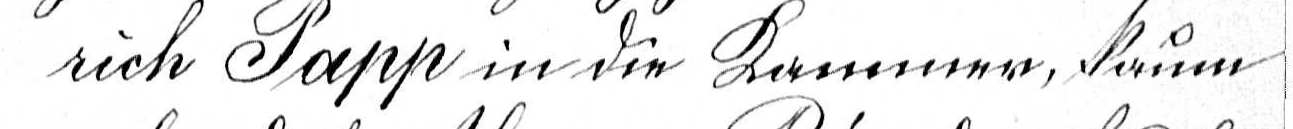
rich Papp in die Kammer, kaum
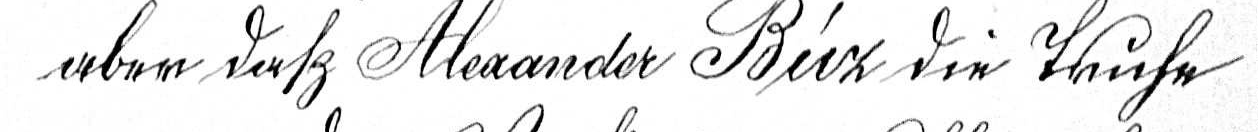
aber daß Alexander Búz die Truhe
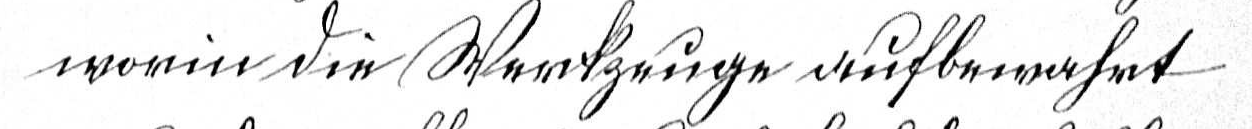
worin die Werkzeuge aufbewahrt
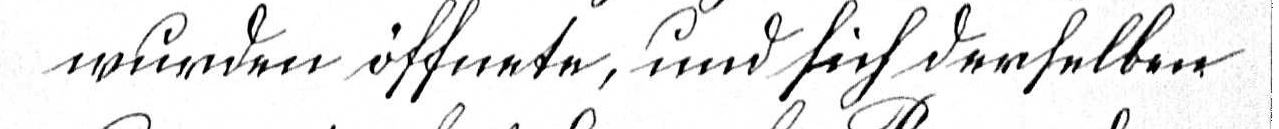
wurden öffnete, und sich derselben
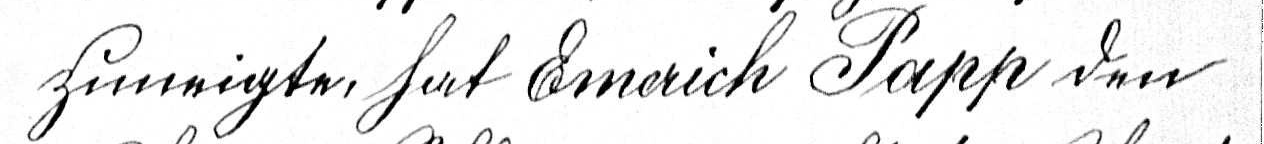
zuneigte, hat Emerich Papp den
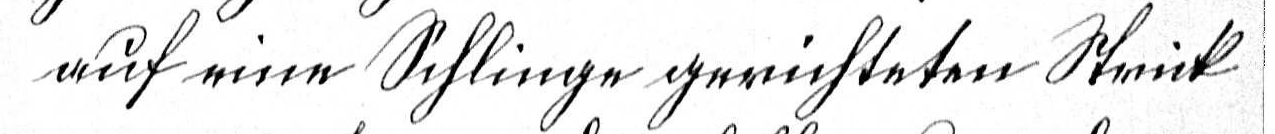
auf eine Schlinge gerichteten Strick
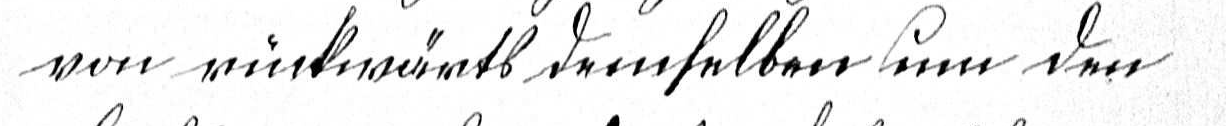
von rückwärts demselben um den
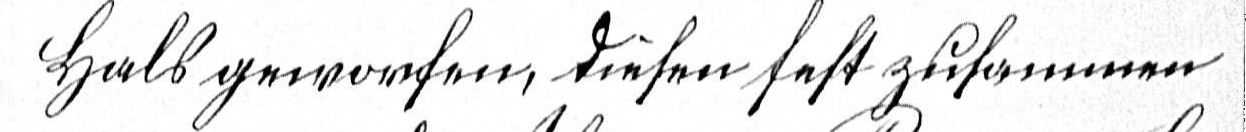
Hals geworfen, dieser fast zusammen
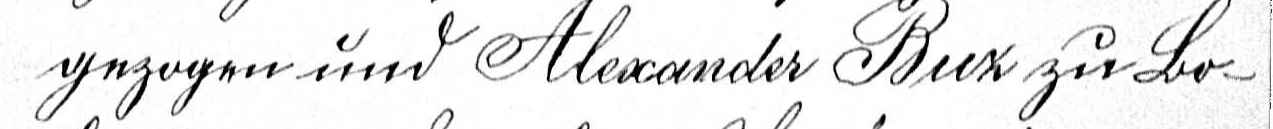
gezogen und Alexander Buz zu Bo¬
